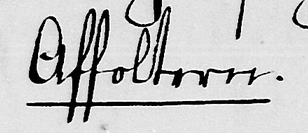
Affoltern.
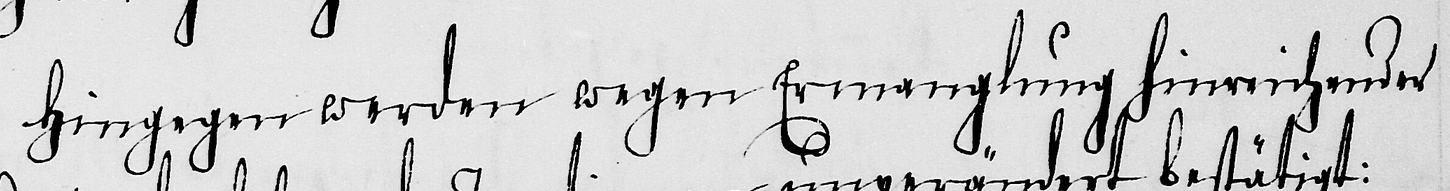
Hingegen werden wegen Ermanglung hinreichender
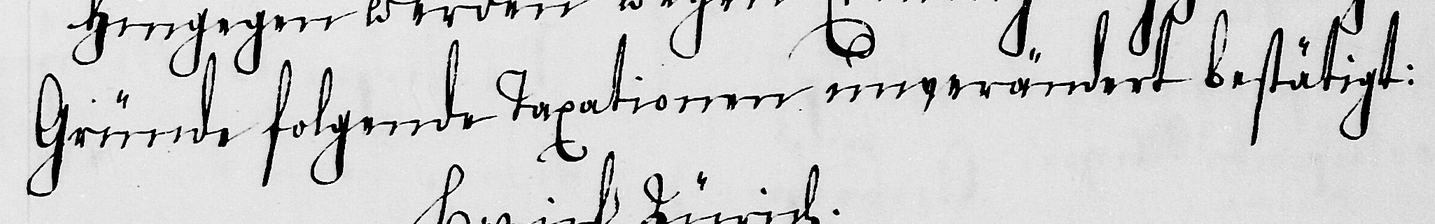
Gründe folgende Taxationen unverändert bestätigt:
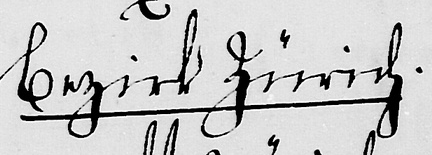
Bezirk Zürich.
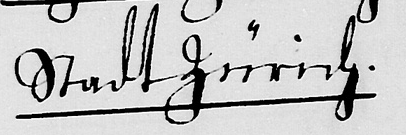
Stadt Zürich.
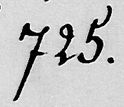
725.
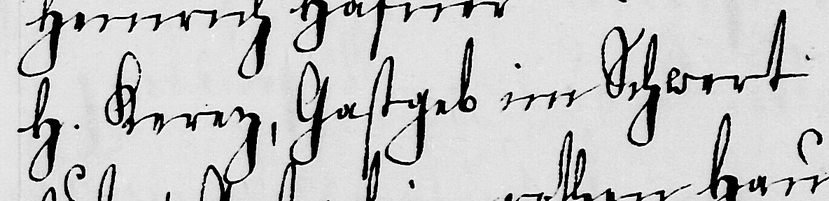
H. Kerez, Gastgeb im Schwer¬
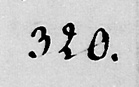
320.
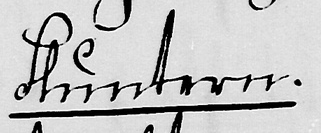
Fluntern.
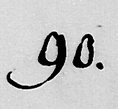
90.
